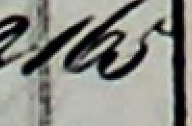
165
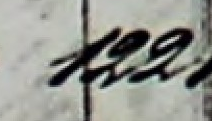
122
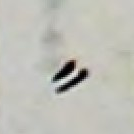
„
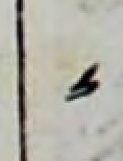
„
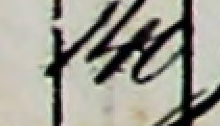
140
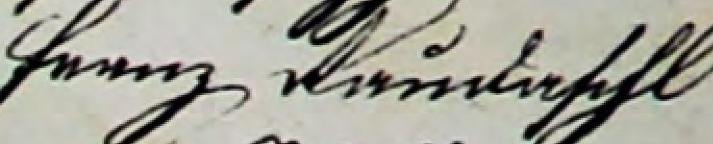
Franz Raudaschl
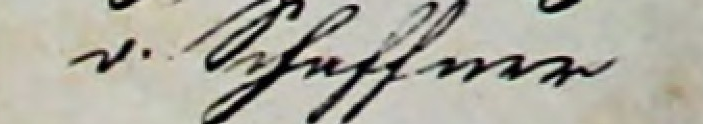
v. Schaffner
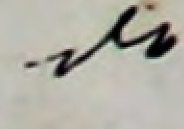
do
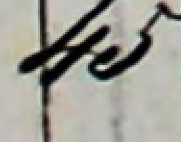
45
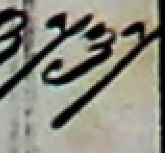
737
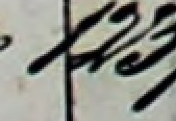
123
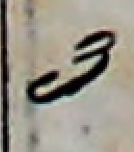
3
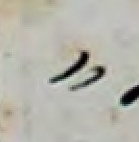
„
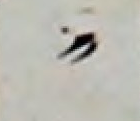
„
